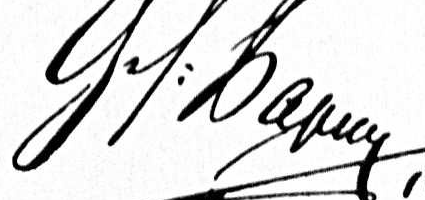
Grf Papay
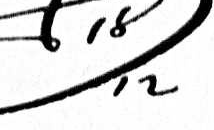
18/12
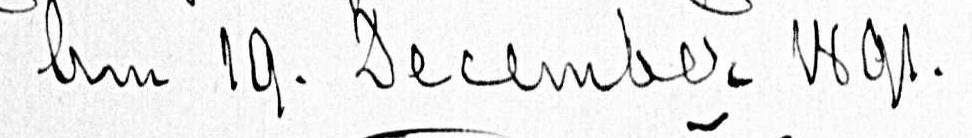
Am 19. December 1891
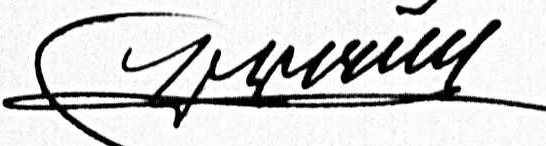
Braun
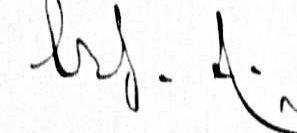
Ah. E.
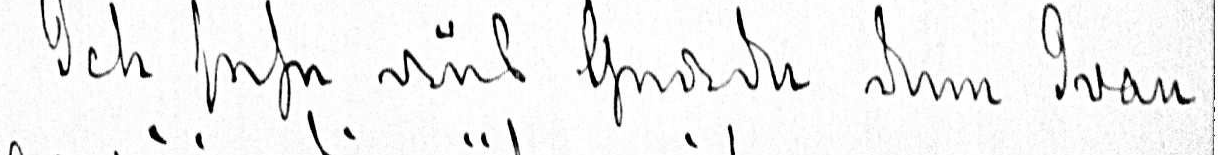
Ich sehe aus Gnade dem Ivan
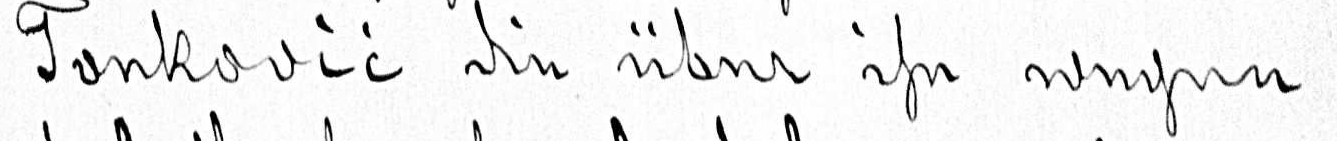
Tonković die über ihn wegen
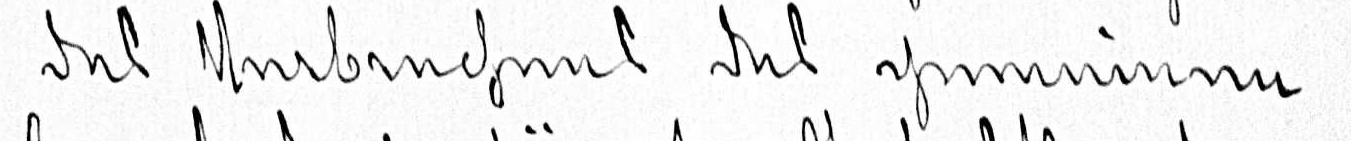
des Verbrechens des gemeinen
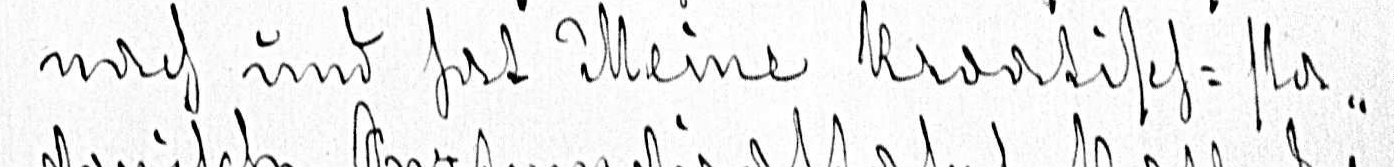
nach und hat Meine kroatisch-sla¬
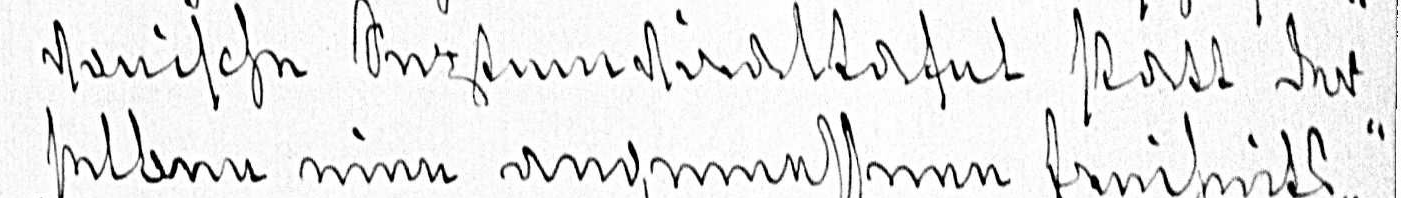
vonische Septemviraltafel, statt der¬
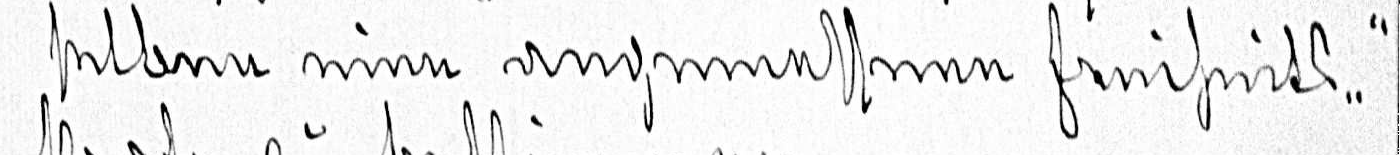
selben eine angemessene Freiheits¬
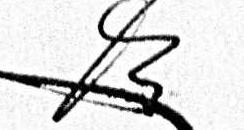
FJ
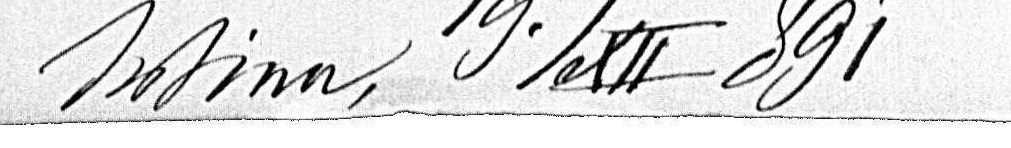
Wien 19.XII 891
